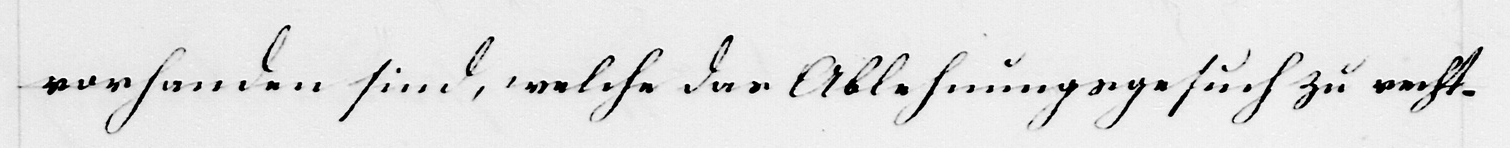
vorhanden sind, welche das Ablehnungsgesuch zu recht¬
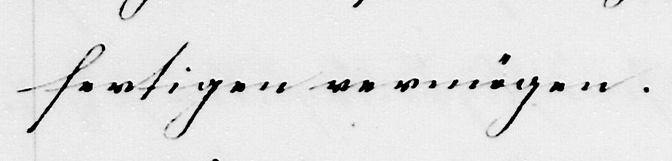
fertigen vermögen.
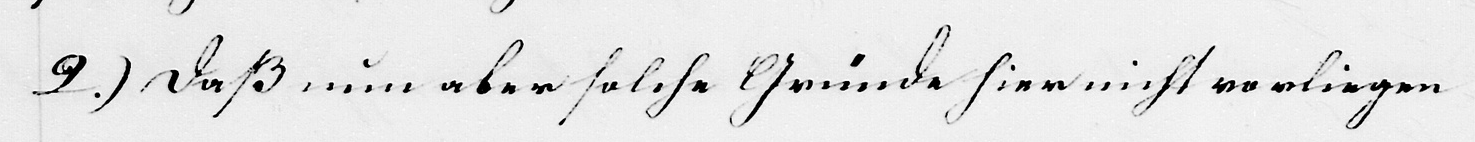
2.) Daß nun aber solche Gründe hier nicht vorliegen
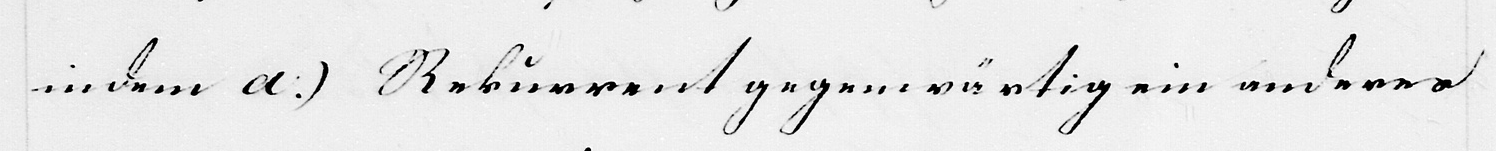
indem a.) Rekurrent gegenwärtig ein anderes
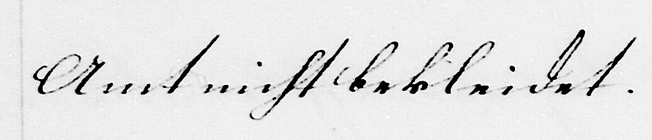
Amt nicht bekleidet.
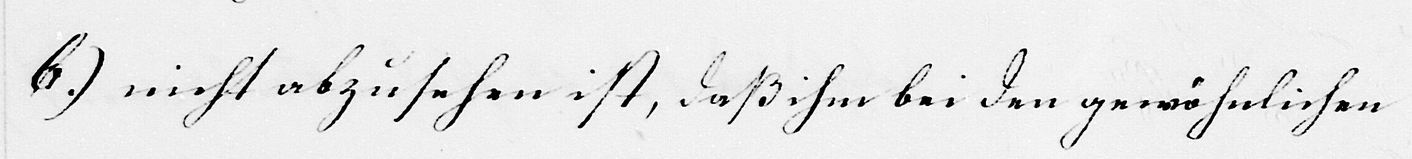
b.) nicht abzusehen ist, daß ihm bei den gewöhnlichen
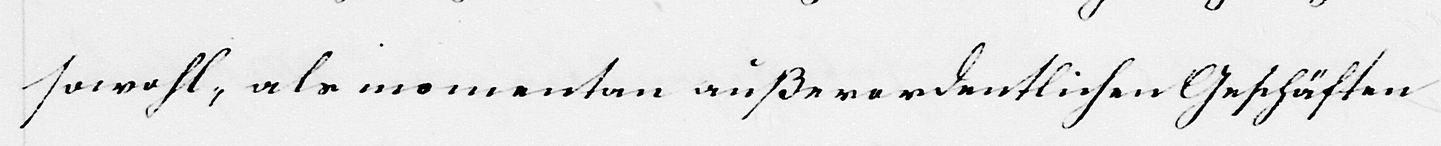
sowohl, als momentan außerordentlichen Geschäften
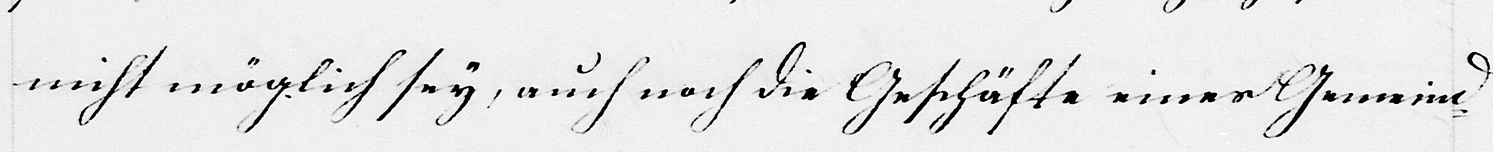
nicht möglich sey, auch noch die Geschäfte eines Gemeind¬
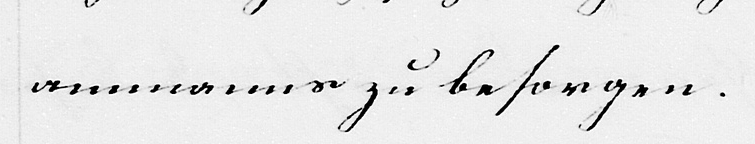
ammanns zu besorgen.
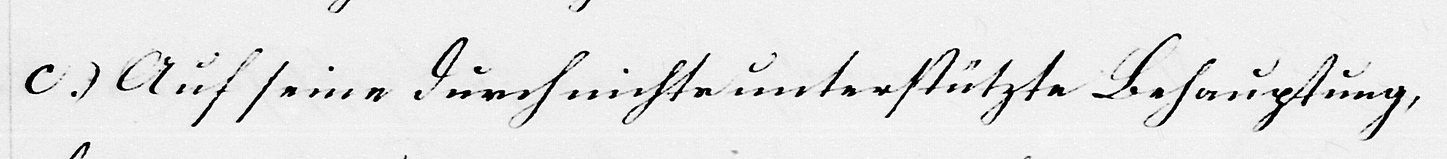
c.) Auf seine durch nichts unterstützte Behauptung,
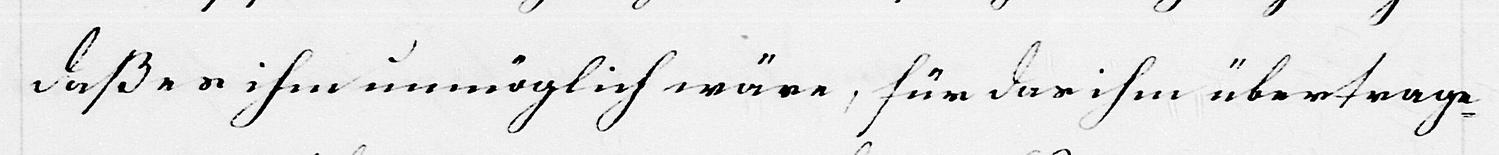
daß es ihm unmöglich wäre, für das ihm übertrage¬
